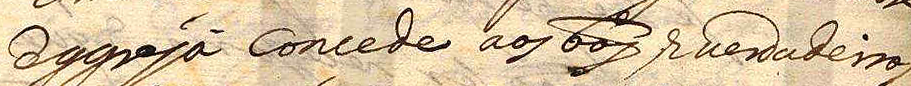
eggreja concede aos bōs, E uerdadeiros
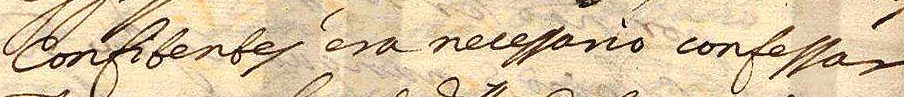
Confitentes era necessario confessar
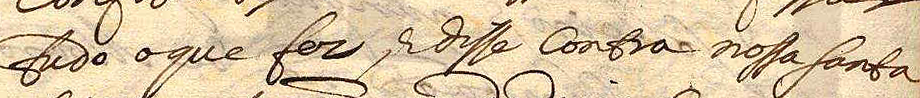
tudo o que fez, E disse contra nossa santa
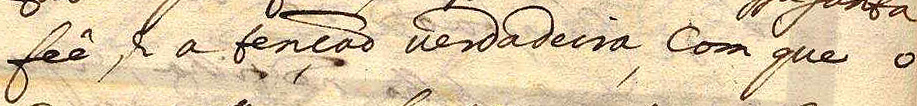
feé, E a tençaõ uerdadeira com que o
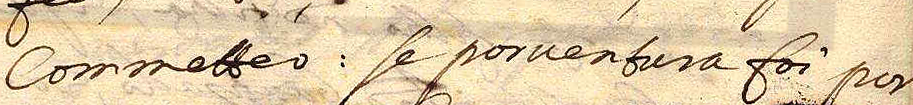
commetteo: se poruentura foi por
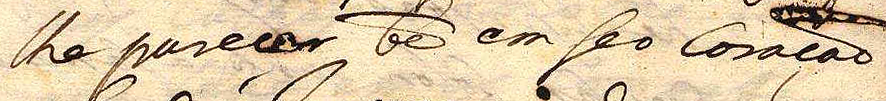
lhe parecer bē em seo coraçaõ
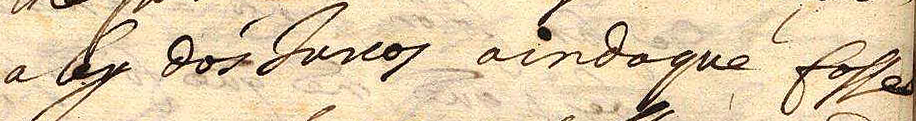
a ley dos turcos, ainda que fosse
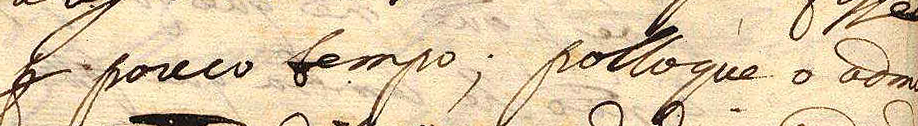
ꝑ pouco tempo; pello que o admo
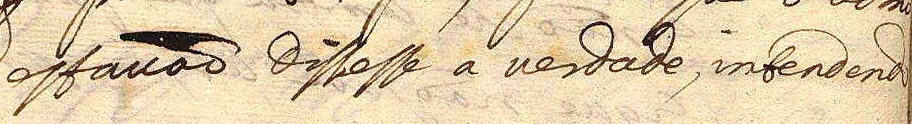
estauão dissesse a uerdade, intendendo
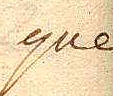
que
